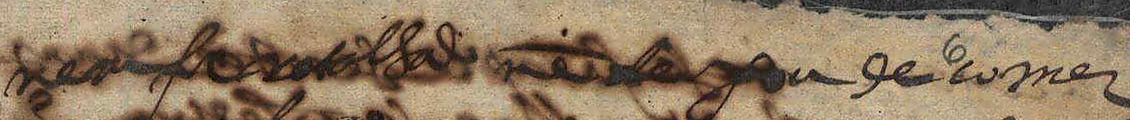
nem foi retalhado nē deixou de comer
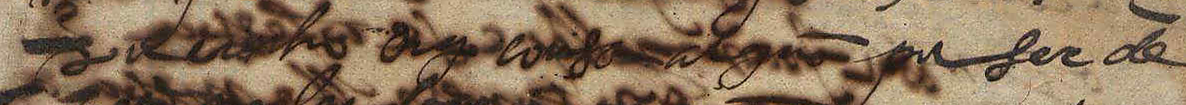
toucinho digo cousa alguā por ser de
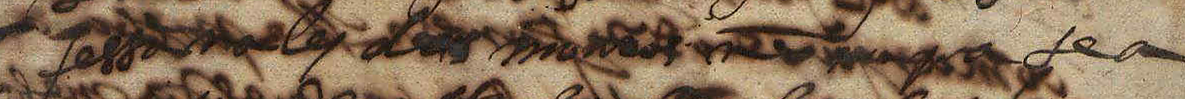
fessa na lej dos mouros nē nunqua se a
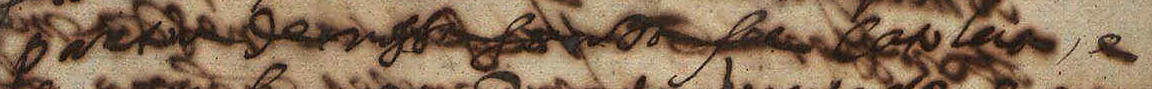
partou de nossa santa fee catolica, e
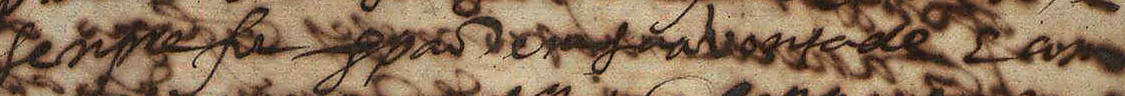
senpre foi xpaõ em sua vontade E com
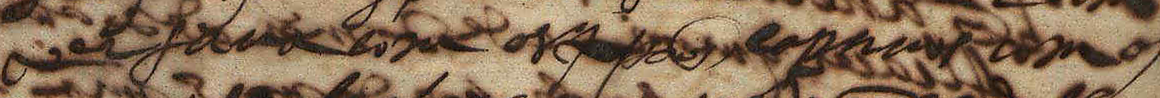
versaua com os xpaõs captiuos com os
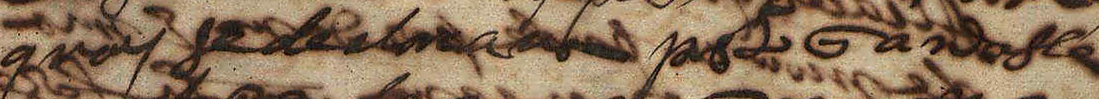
quais se declaraua posto q̄ andasse
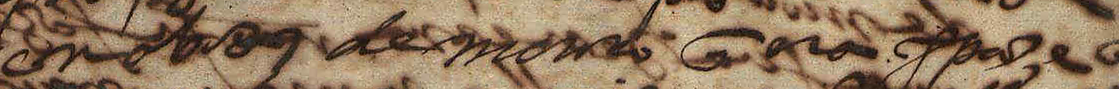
en abitos de mouro q̄ era xpaõ e q̄
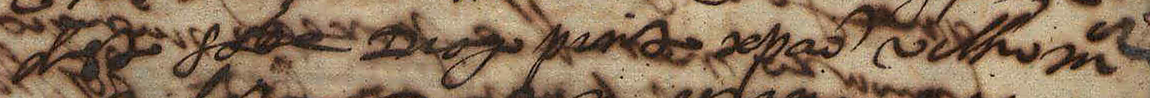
disto sabe Diogo pinto xpaõ velho mor
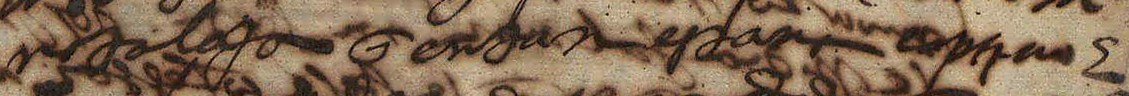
nesta Casa q̄ entam estaua captiuo E
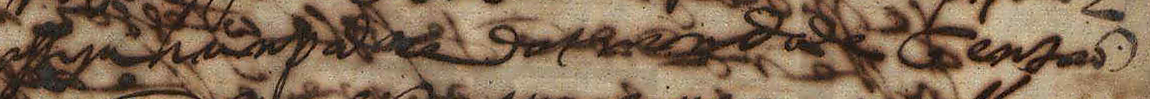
assim hum padre da trindade q̄ entaõ
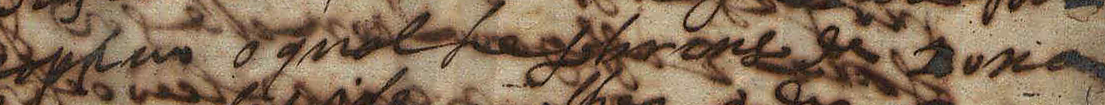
captiuo o qual he sobrinho de Dona
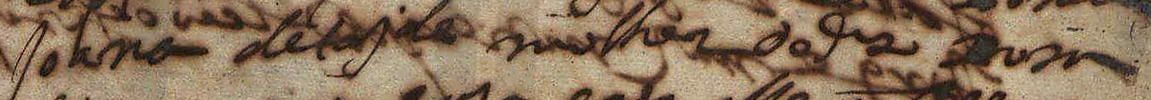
Joana de tajde molher do dito Dom
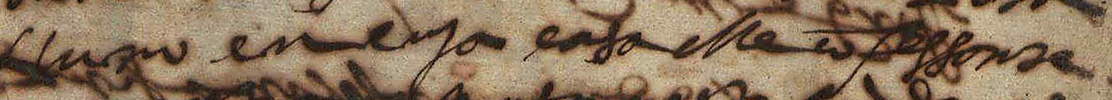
Nuno en cuja casa elle cōfessante
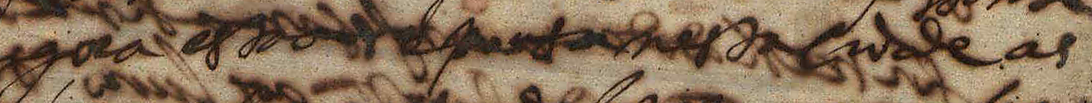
agora estaa e pousa nesta cidade as
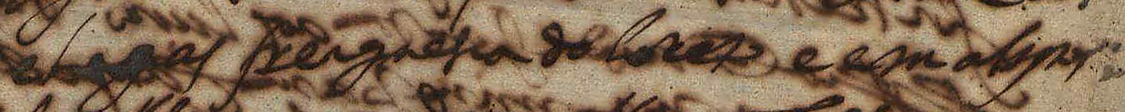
chagas frerguesia do loreto, e em abjtos
